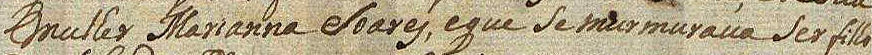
mulher Marianna Soares, e que se murmuraua ser filho
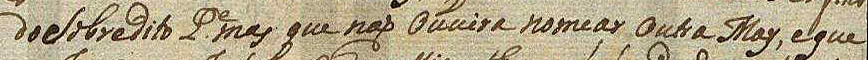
do Sobredito P.e mas que naõ ouuira nomear outra May, e que
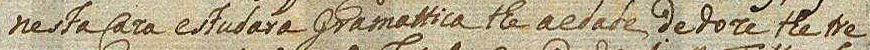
nesta Caza estudara Gramattica the a edade de doze the tre
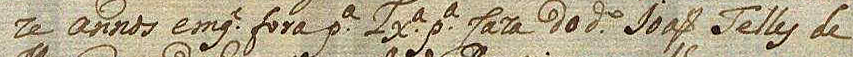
ze annos em q̄ fora p.a Lx.a p.a Caza do d.o Ioaõ Telles de
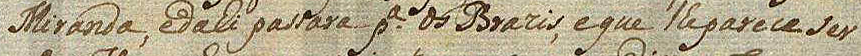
Miranda, e dahi passara p.a os Brazis, e que lhe parece ser
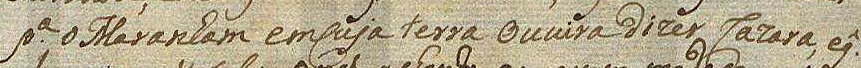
p.a o Maranham em Cuja terra ouuira dizer Cazara, e q̄
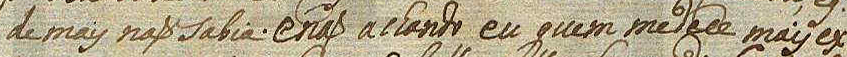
de mais naõ sabia. e naõ achando eu quem me dece mais ex
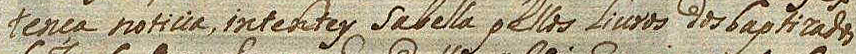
tença noticia, intentey sabella pellos liuros dos baptizados
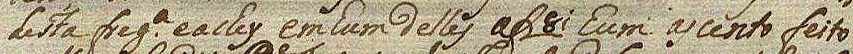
desta freg.a e achey em hum delles a fl 8i hum ascento feito
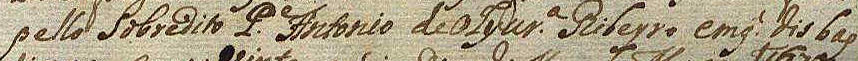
pello sobredito P.e Antonio de Olyur.a Ribeyro em q̄ dis bap
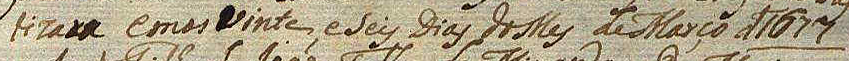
tizara em os vinte, e seis Dias do Mes de Março d̄ 1677
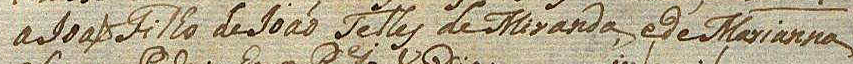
a Ioaõ Filho de Ioaõ Telles de Miranda, e de Marianna
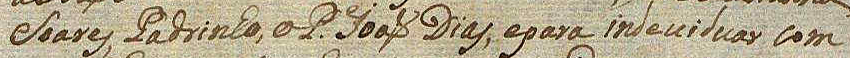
Soares, Padrinho, o P.e Ioaõ Dias, e para indeuiduar com
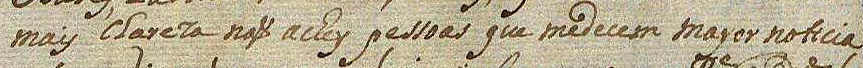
mais clareza naõ achey pessoas que me decem mayor noticia
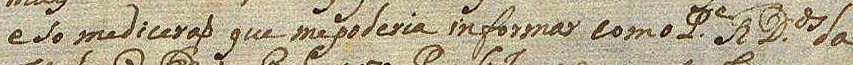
e so me diceraõ que me poderia informar com o P.e R. D.os da
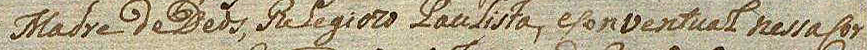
Madre de Deos, Relegiozo Paulista, e conventual nessa Cor
